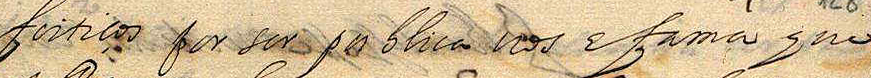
feitiços por ser publica vos E fama que
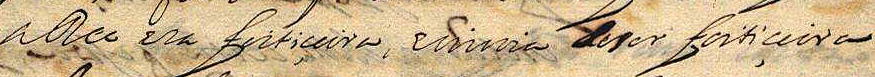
a Ree Era feiticeira, E uiuia de ser feiticeira
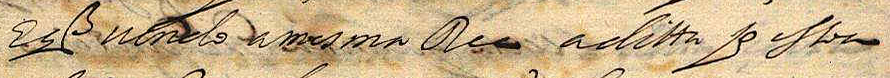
E q̄ uindo a mesma Ree a ditta pessoa
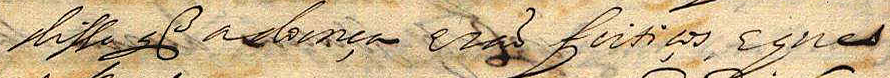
disse q̄ a doença eraõ feitiços, E que
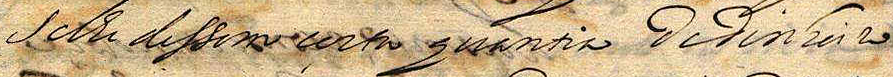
se lhe dessem certa quantia de dinheiro
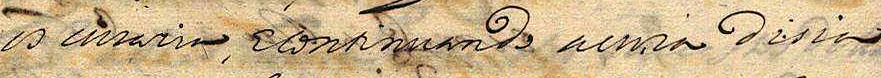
os curaria, E continuando a cura disia
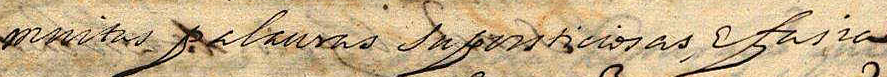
muitas palauras supersticiosas, E fasia
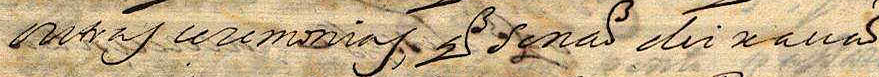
outras ceremonias, q̄ se não deixauaõ
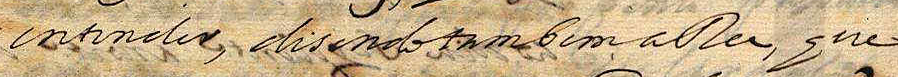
entender, disendo tambem a Ree, que
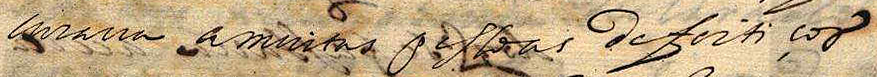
curaua a muitas pessoas de feitiços
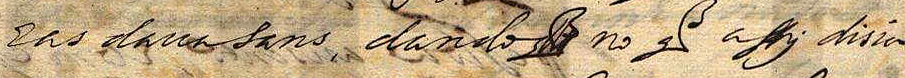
E as daua sans, dando _ no q̄ assy disia
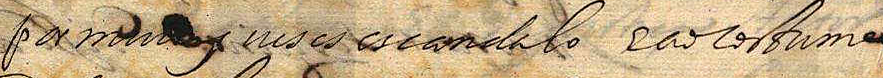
por mutas ueses escandalo, E ao costume
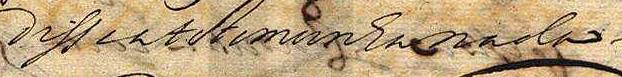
disse a testemunha nada
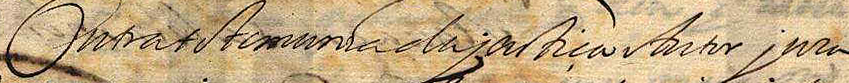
Outra testemunha da justiça Autor jura
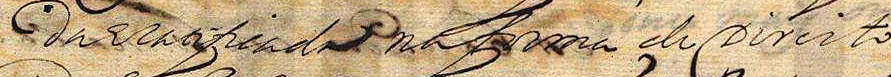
da E Ratificada na forma de Direito
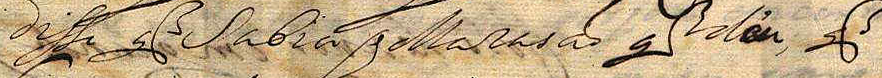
dise q̄ sabia pella rasaõ q̄ deu, q̄
